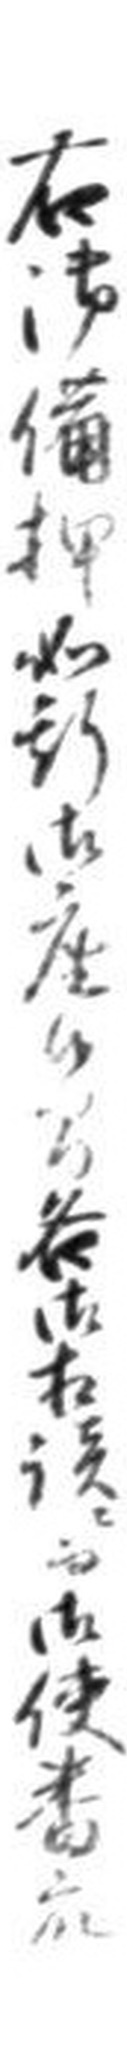右御備押如斯御座候間各御相談ニ而御使番衆
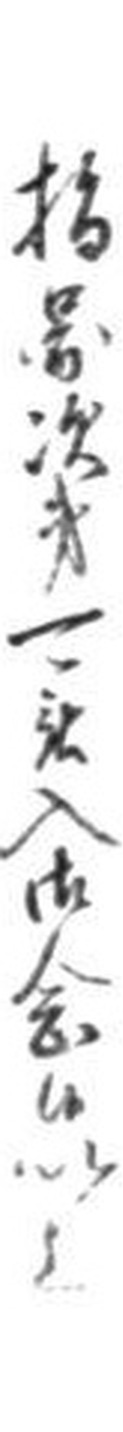指図次第可被入御念候以上
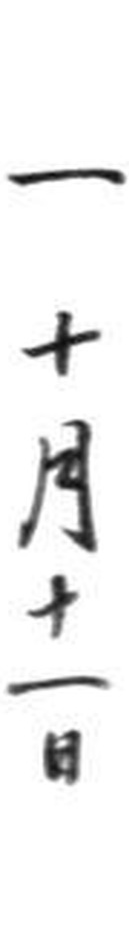一十月十一日
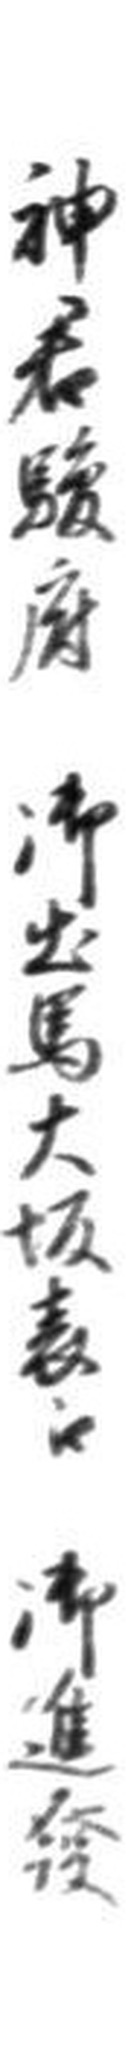神君駿府御出馬大坂表江御進発
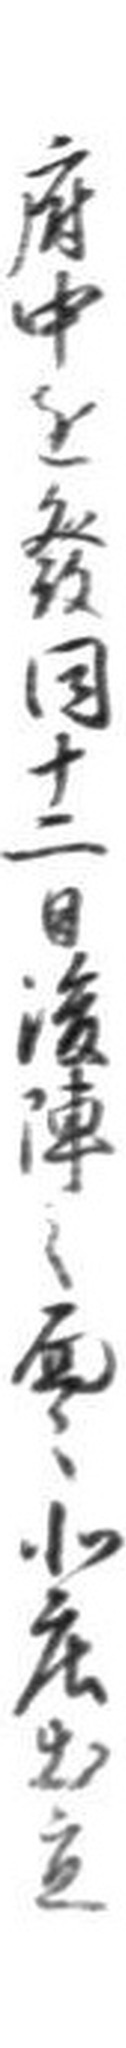府中を発同十二日後陣之面々北庄出立
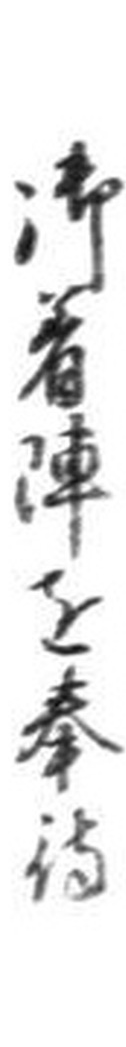御着陣を奉待
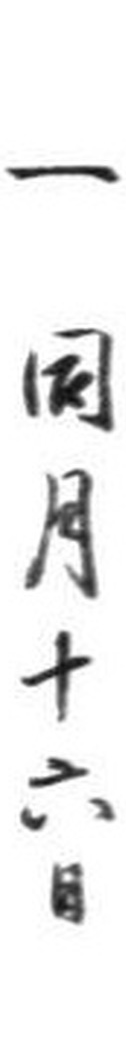一同月十六日

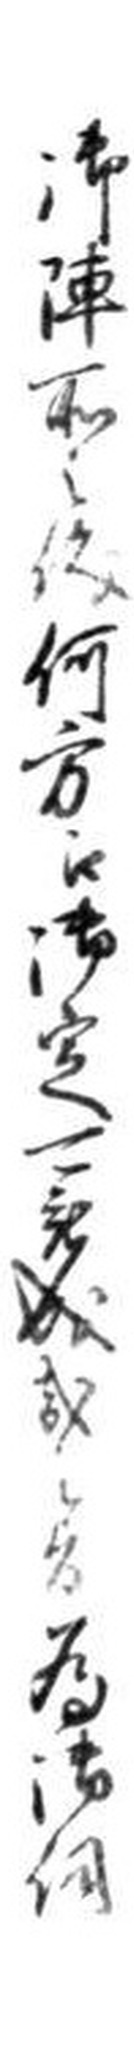御陣所之儀何方江御定可被成哉之旨為御伺
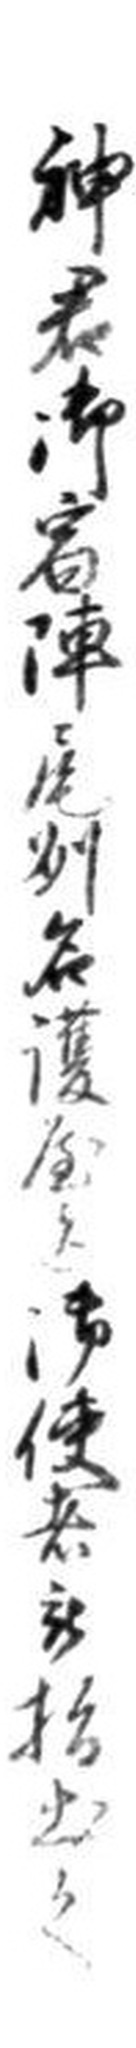神君御宿陣尾州名護屋迄御使者被指出之
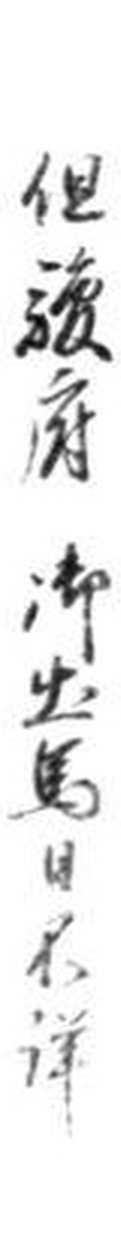但駿府御出馬日不詳
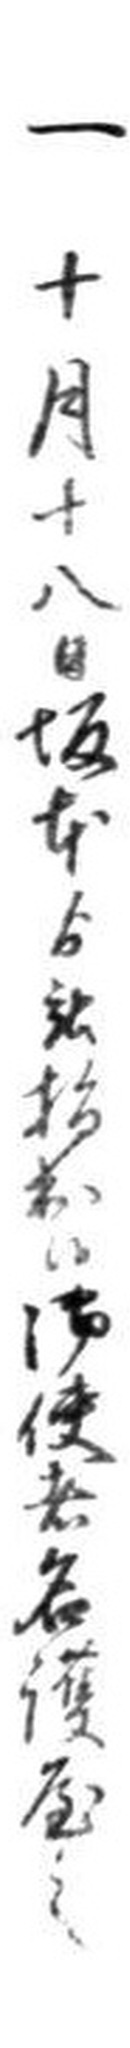一十月十八日坂本ゟ被指出候御使者名護屋之
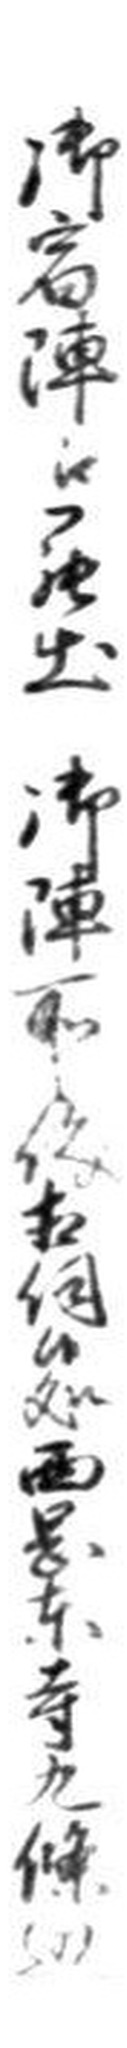御宿陣江罷出御陣所之儀相伺候処西岡東寺九條辺
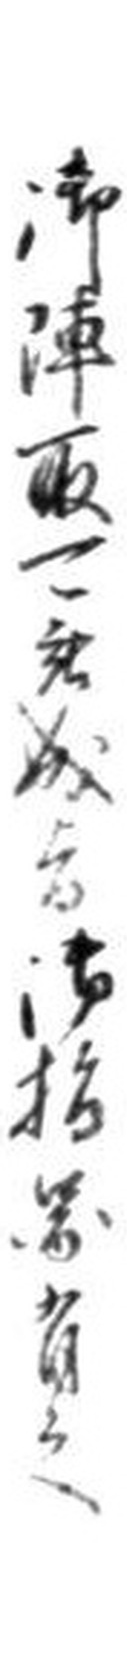御陣取可被成旨御指図有之
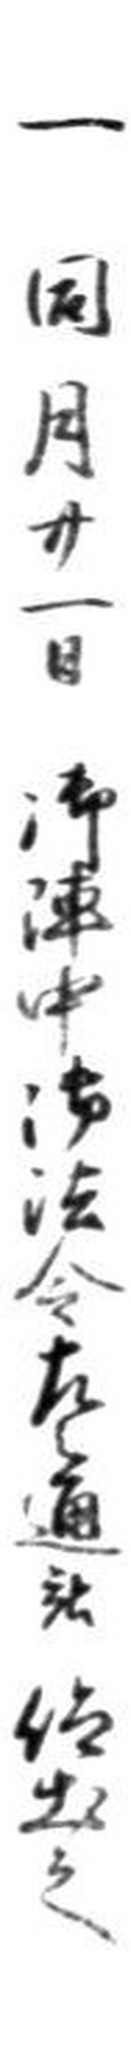一同月廿一日御陣中御法令左之通被仰出之
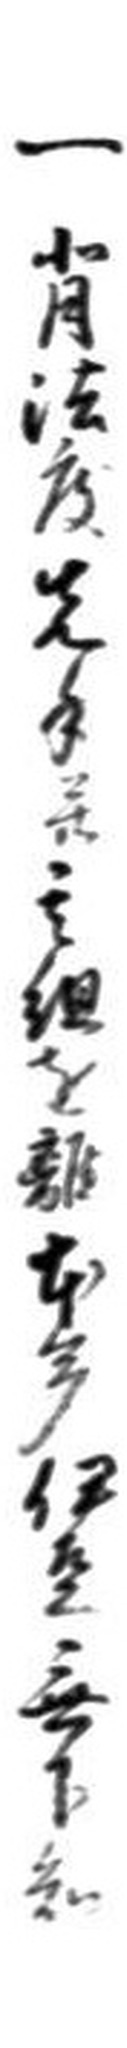一背法度先手并其組を離本多伊豆無下知
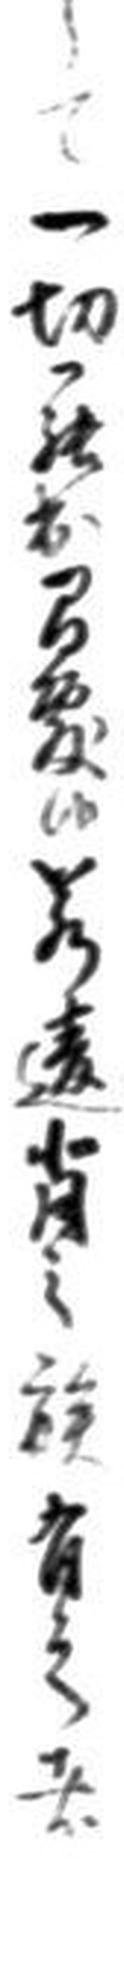して一切罷出間敷候若違背之族有之者
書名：家譜 二 忠直公 従文禄四年到慶安四年
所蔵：福井県文書館 Fukui Prefectural Archives
